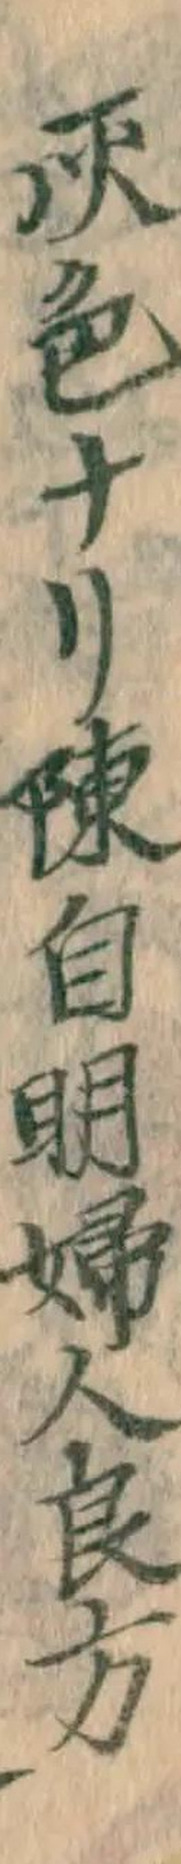灰色ナナリ陳自明婦人良方
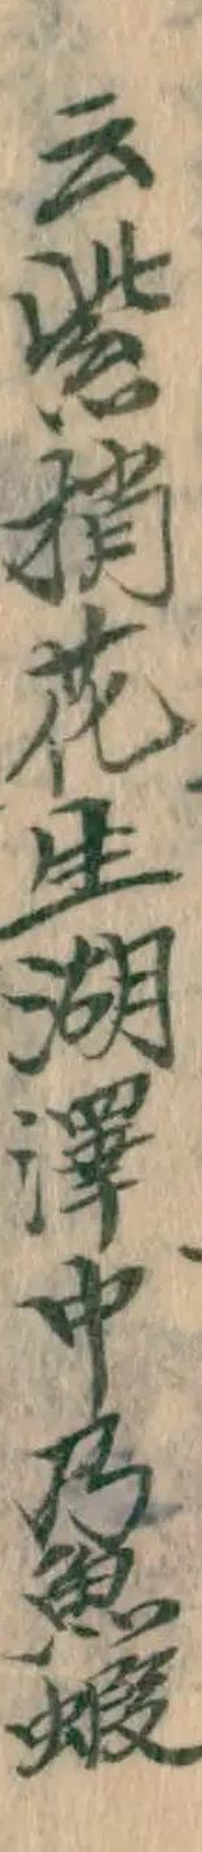云紫稍花生湖澤中乃魚蝦
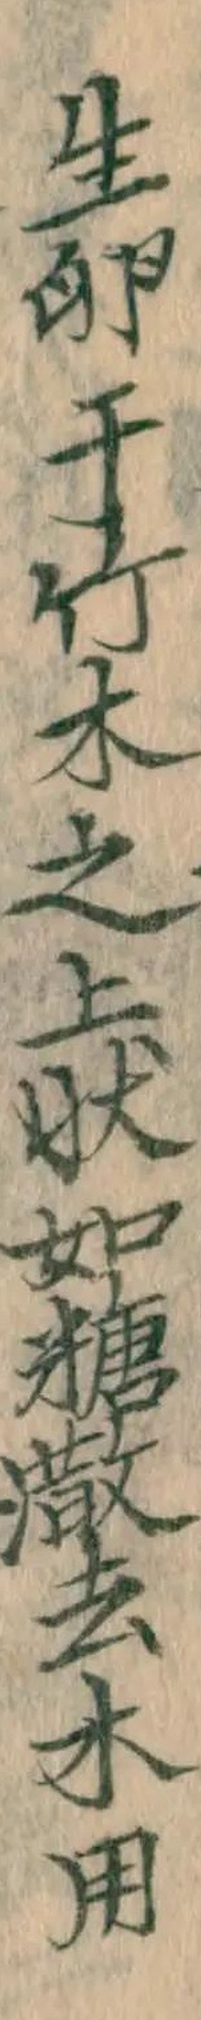生卵于竹木之上状如糖潵去木用
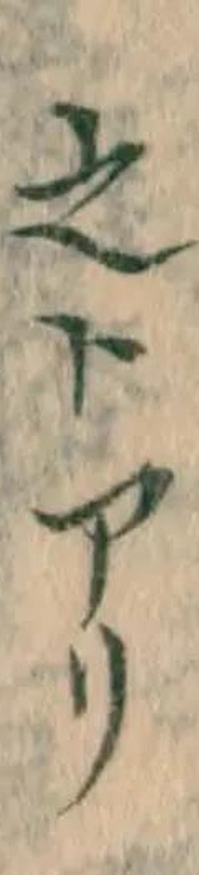之トアリ
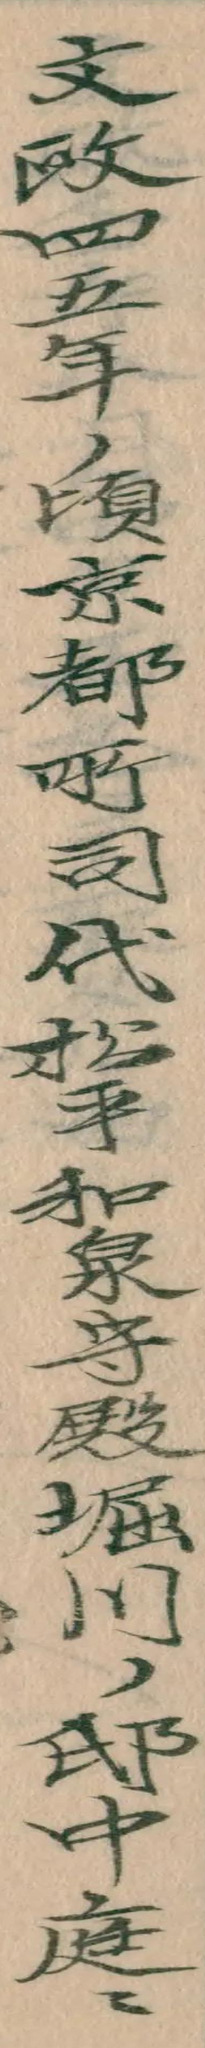文政四五年ノ頃京都所司代松平和泉守殿堀川ノ邸中庭ニ
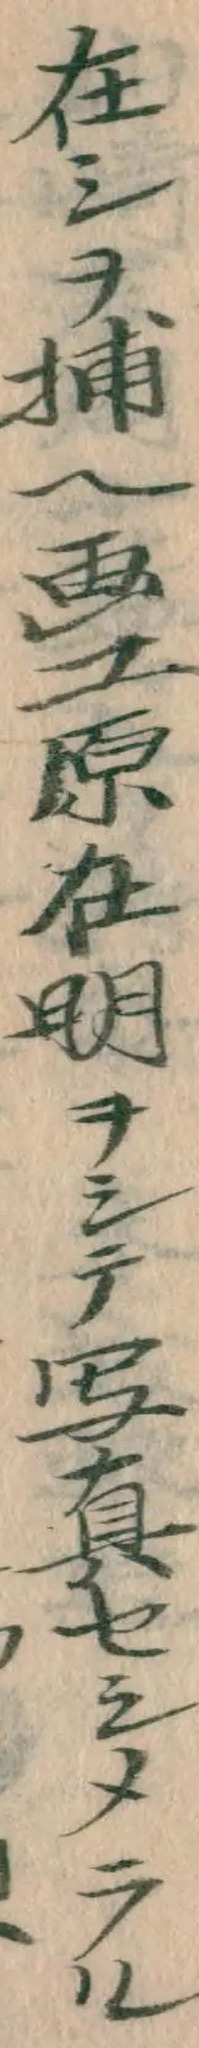在シヲ捕ヘ画工原在明ヲシテ写真セシメラル
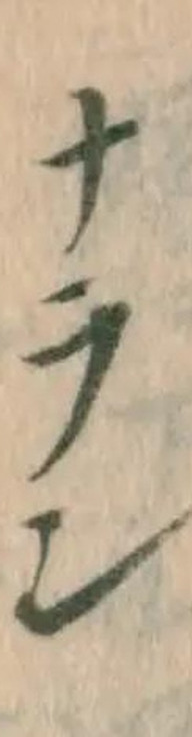ナラン

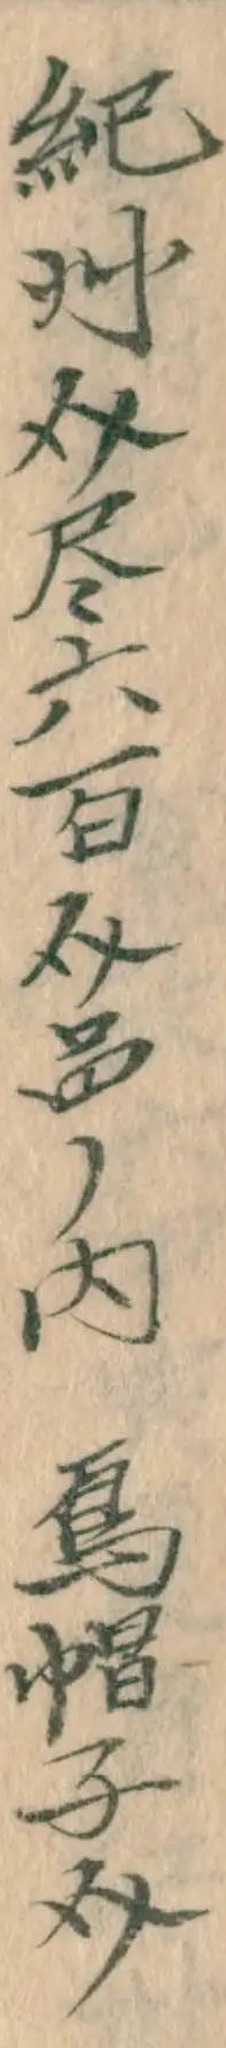紀州介尽六百介品ノ内烏帽子介
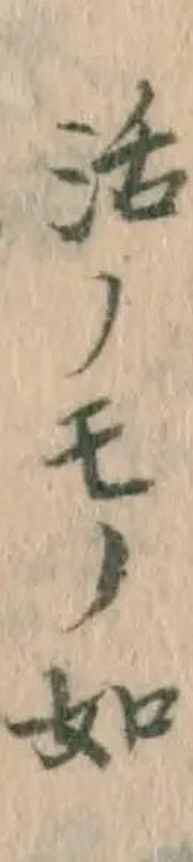活ノモノ如
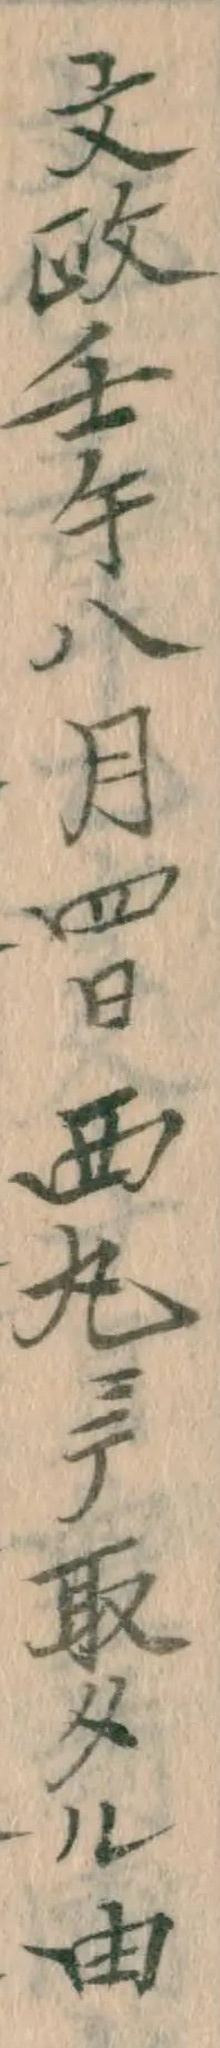文政壬午八月四日西丸ニテ取タル由
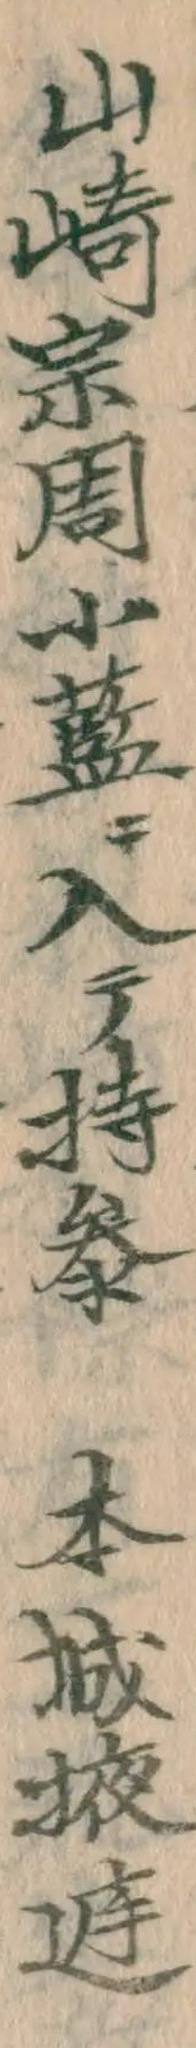山崎宗周小籃ニ入テ持参本城掖
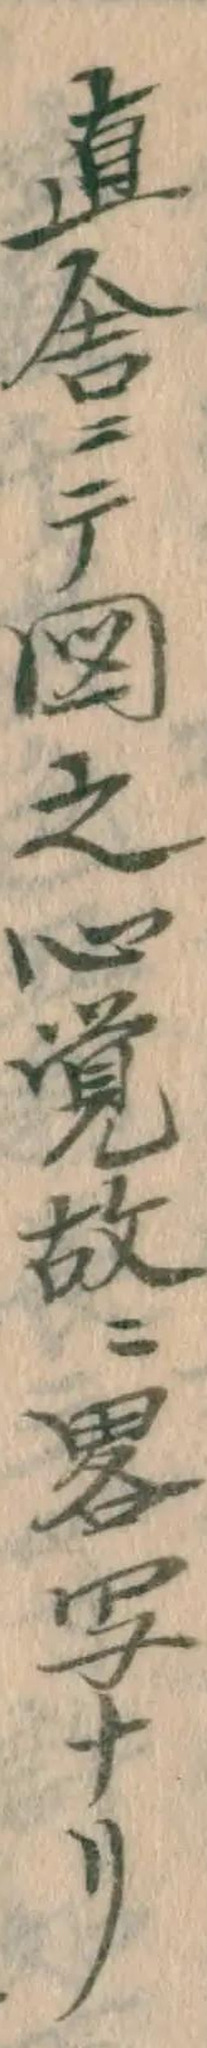直舎ニテ図之心覚故ニ畧写ナリ
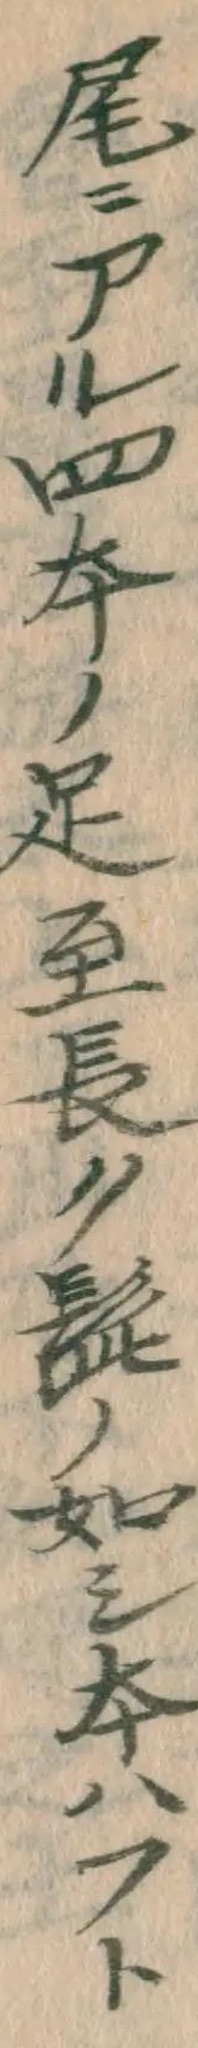尾ニアル四本ノ足至長ク髭ノ如シ本ハフト
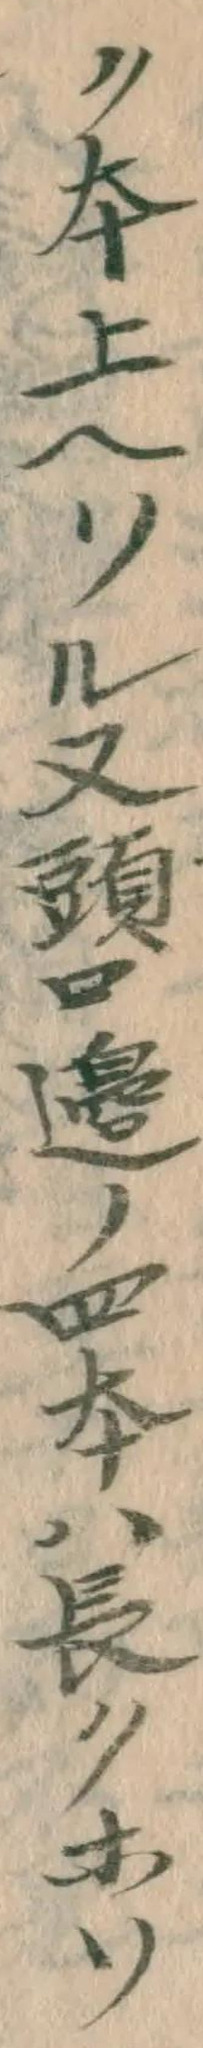ク本上ヘソル又頭口邉ノ四本ハ長クホソ

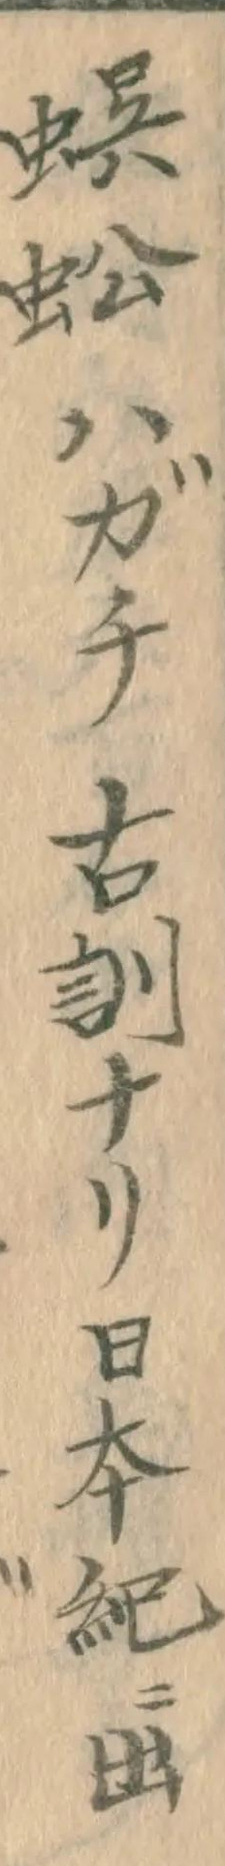蜈蚣ハガチ古訓ナリ日本紀ニ出
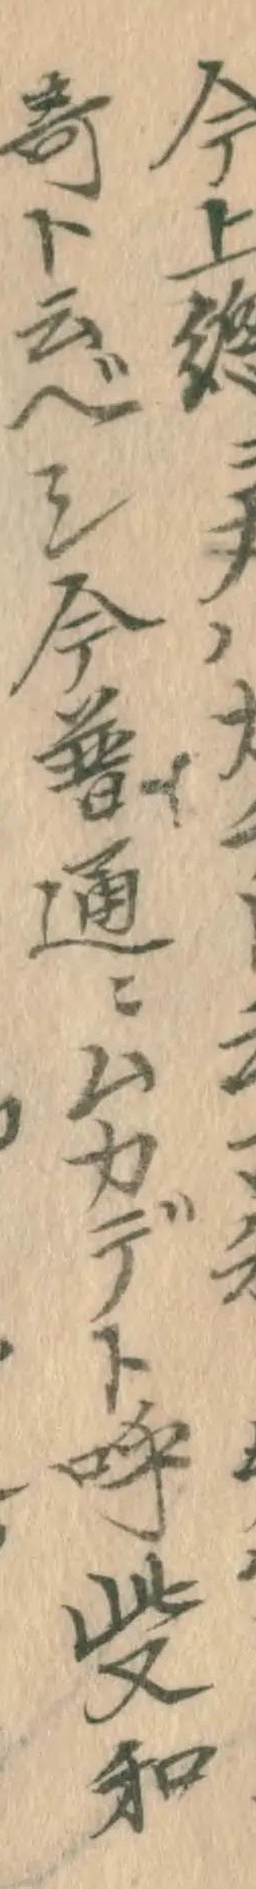奇ト云ベシ今普通ニムカデト呼此又和
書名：千蟲譜 3巻. [2]
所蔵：国立国会図書館 National Diet Library, JAPAN
